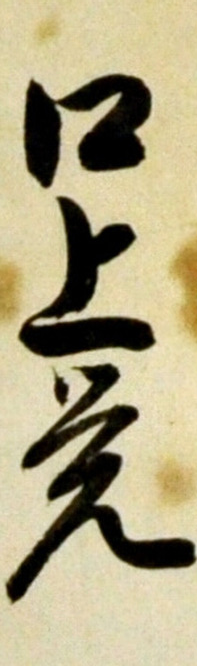口上覚
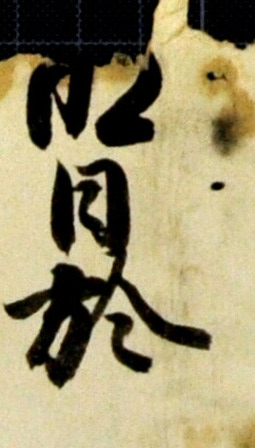明日於
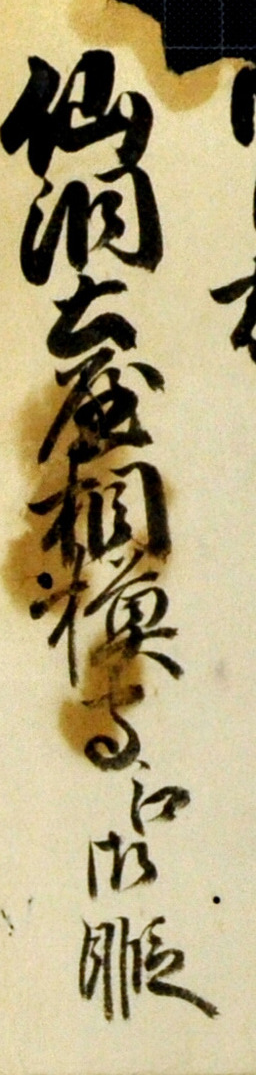仙洞土屋相模守え御暇
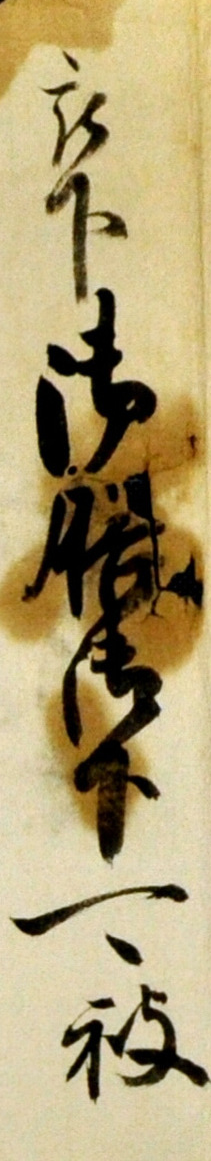被下御膳御下可被
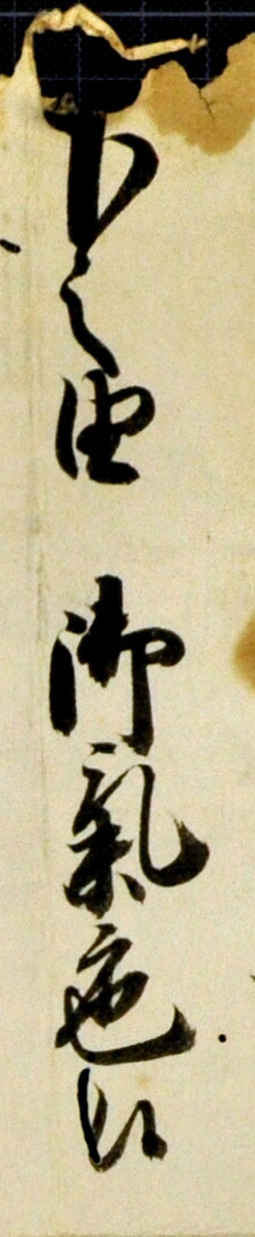下之由御気色候
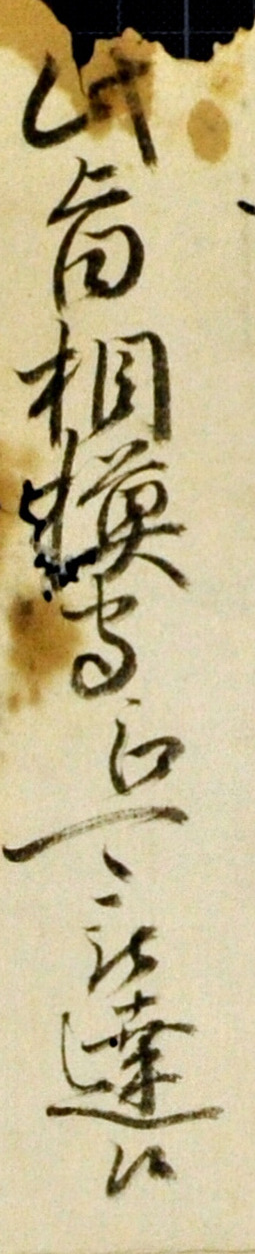此旨相模守え可被達候
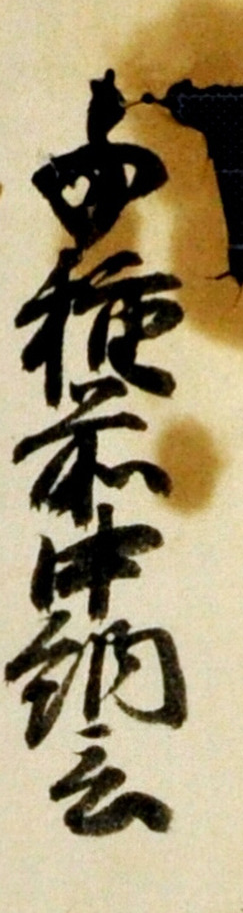千種前中納言
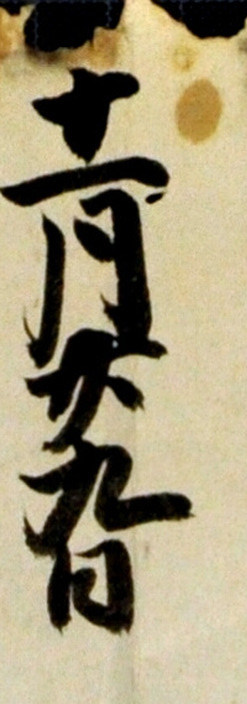十一月廿九日
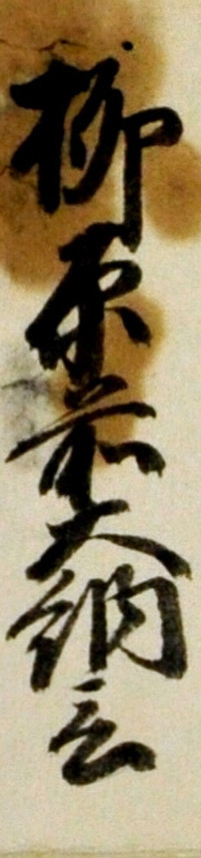柳原前大納言
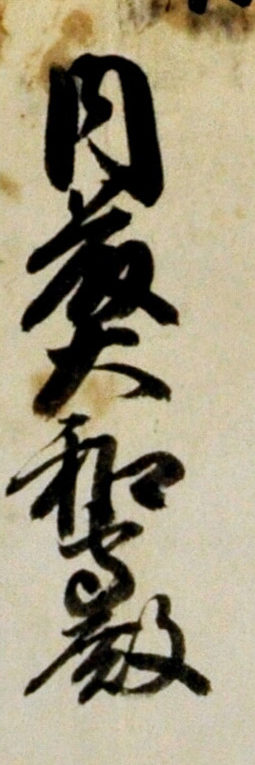内藤大和守殿
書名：口上覚
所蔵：伊那市立高遠町図書館・合同会社AMANE
